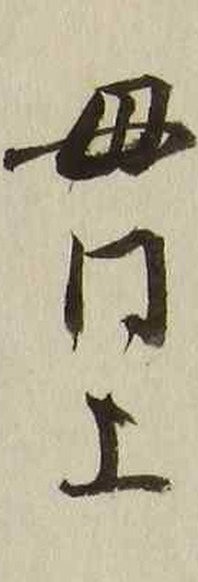母同上
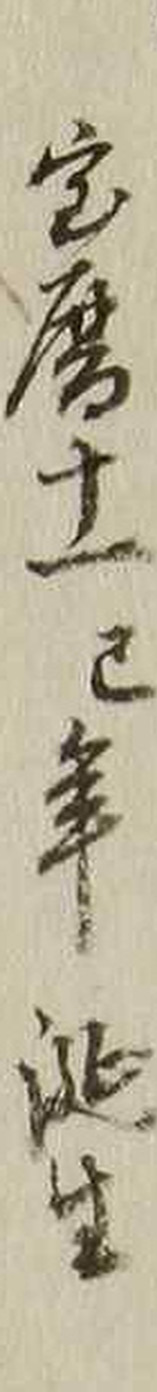宝暦十一巳年誕生
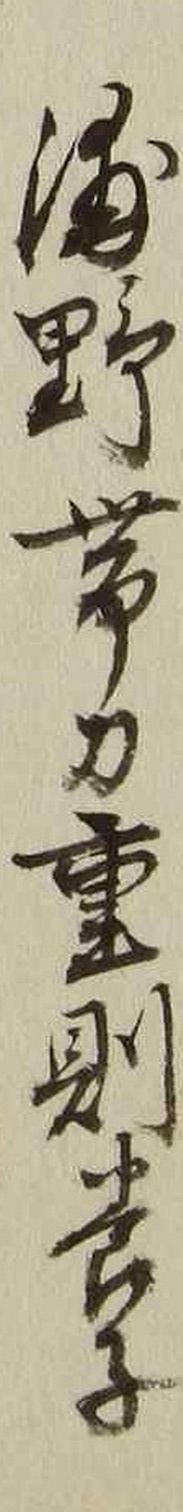浦野帯刀重則養子
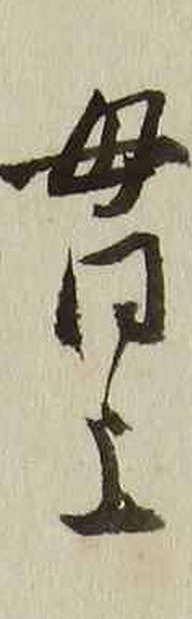母同上
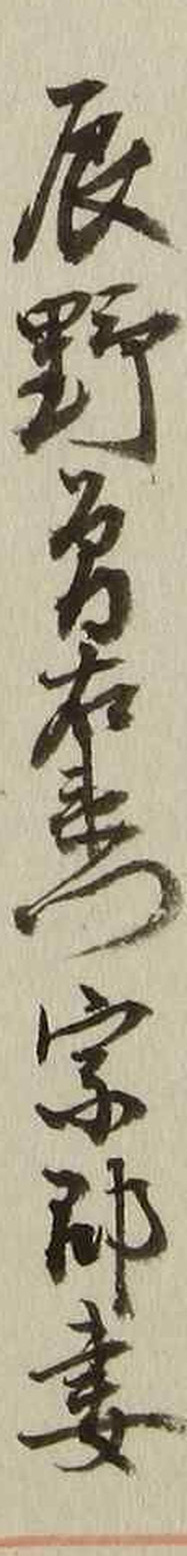女辰野曽右衛門宗郡妻
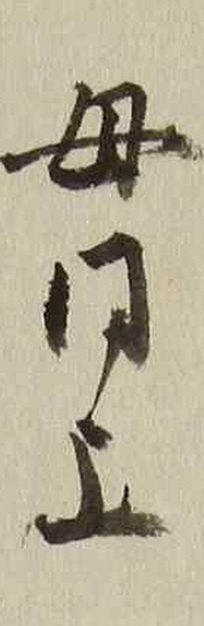母同上
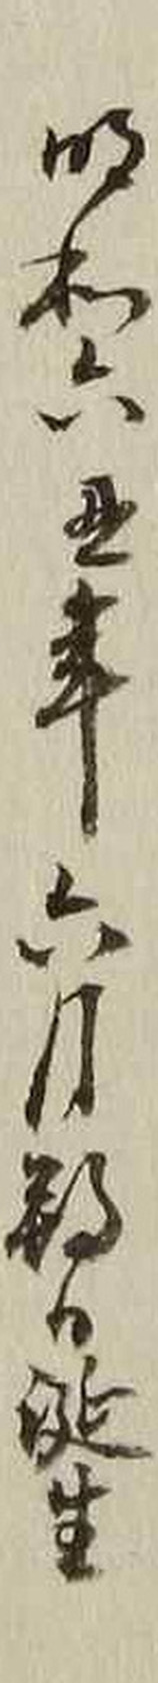明和六丑年六月朔日誕生
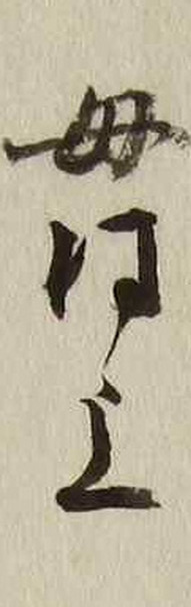母同上
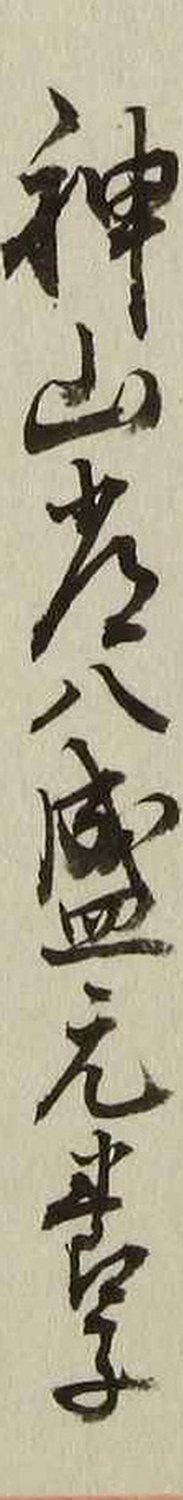神山常八盛元養子
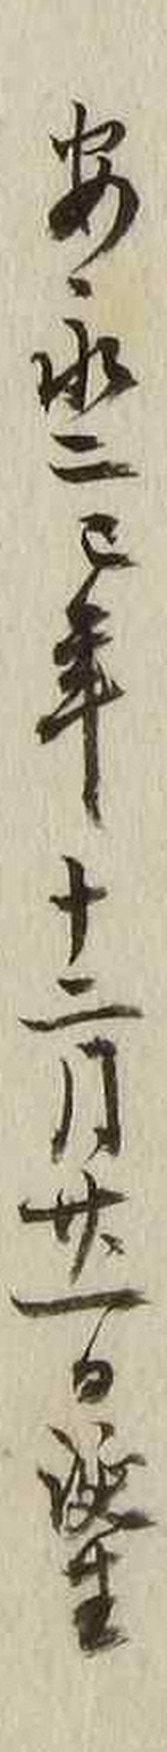安永二巳年十二月廿一日誕生
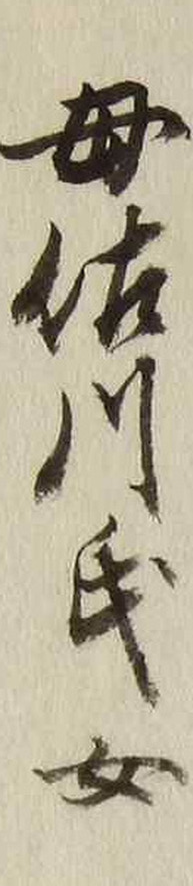母佐川氏女
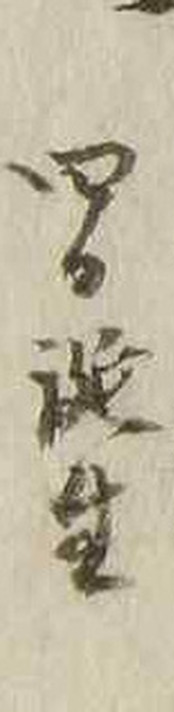四日誕生
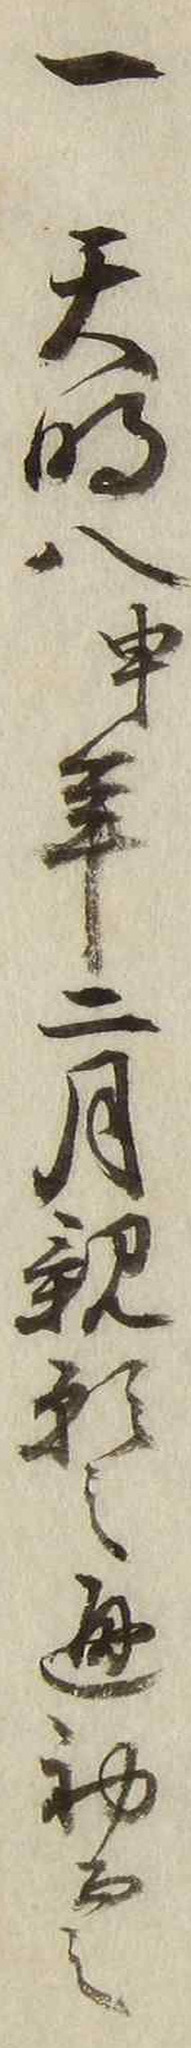一天明八申年二月親願之通初而之

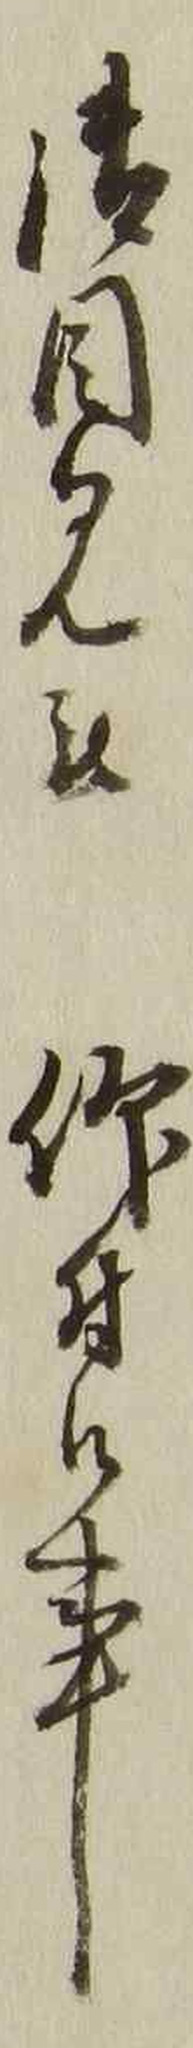御目見被仰付候事
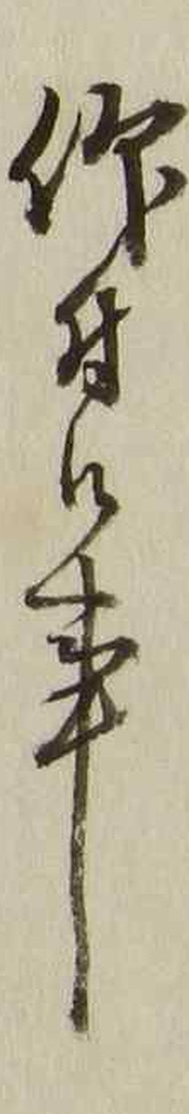仰付候事
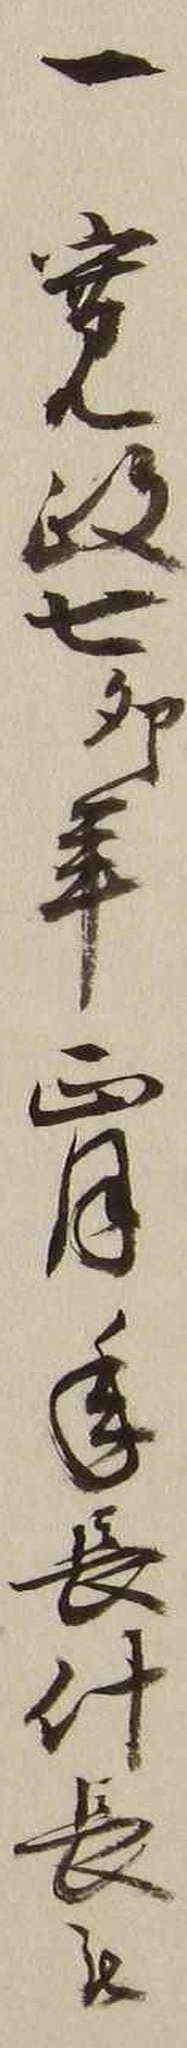一寛政七卯年正月年長什長被
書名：諸士系譜　巻之23　い之部23
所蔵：会津若松市立会津図書館
